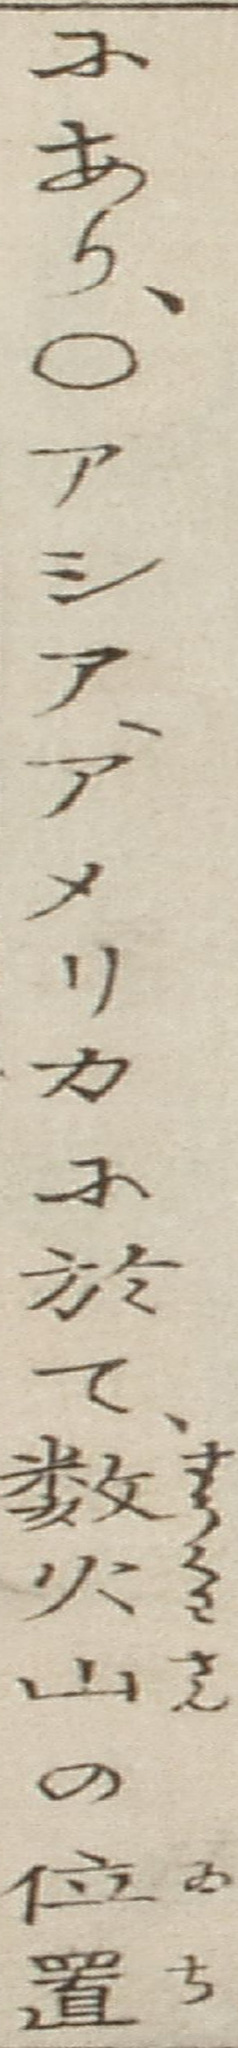にあり、〇アシア、アメリカに於て、数火山の位置
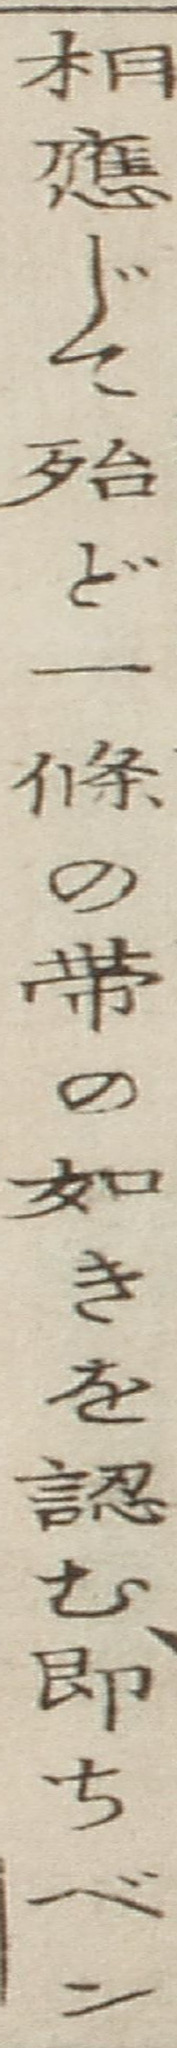相応じて、殆ど一条の帯の如きを認む、即ちベン
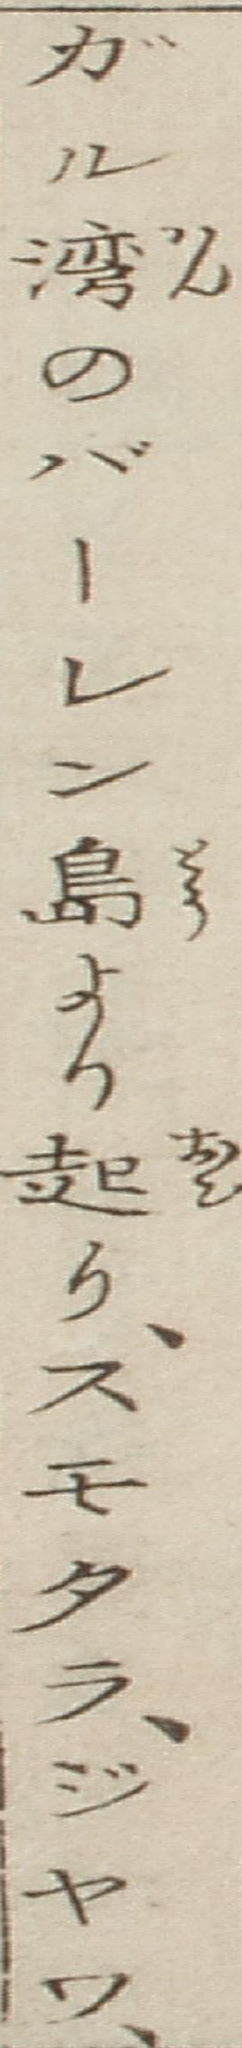ガル湾のバーレン島より起り、スモタラ、ジャワ、
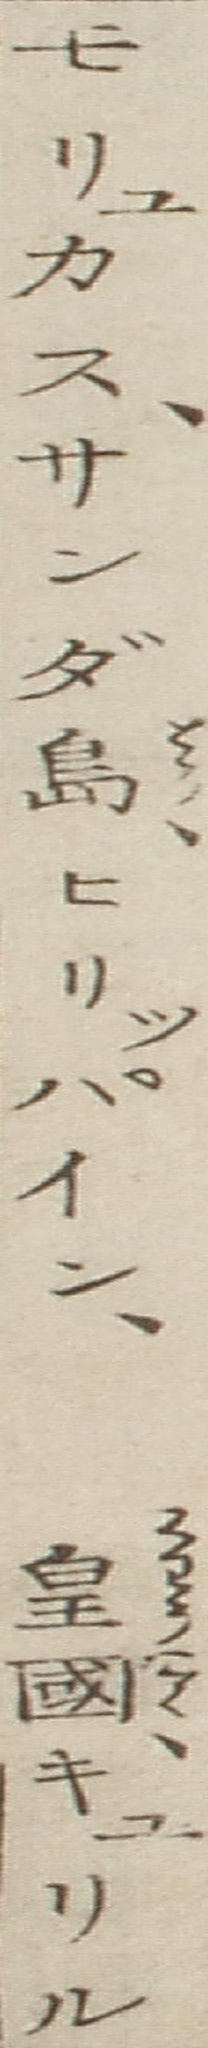モリュカス、サンダ島、ヒリッパイン、皇国、キュリル

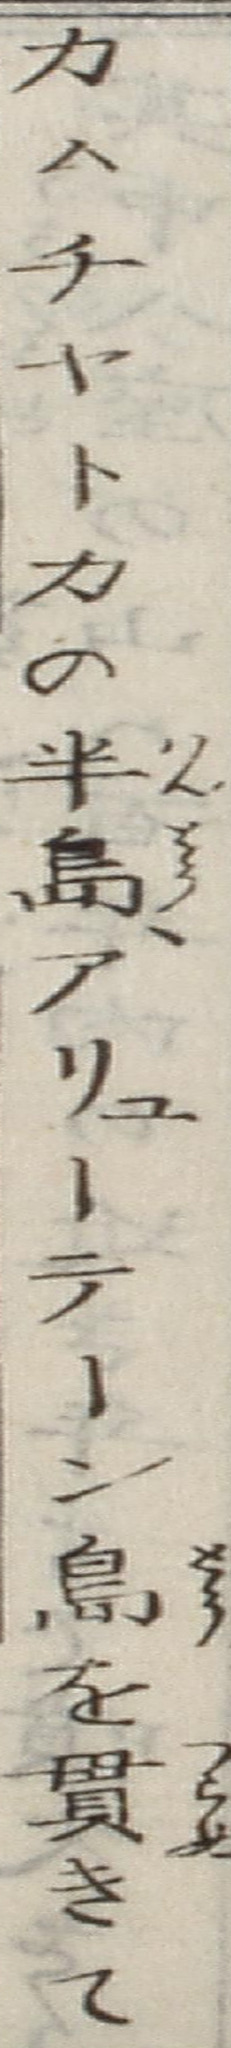カムチヤトカの半島、アリューテーン島を貫きて
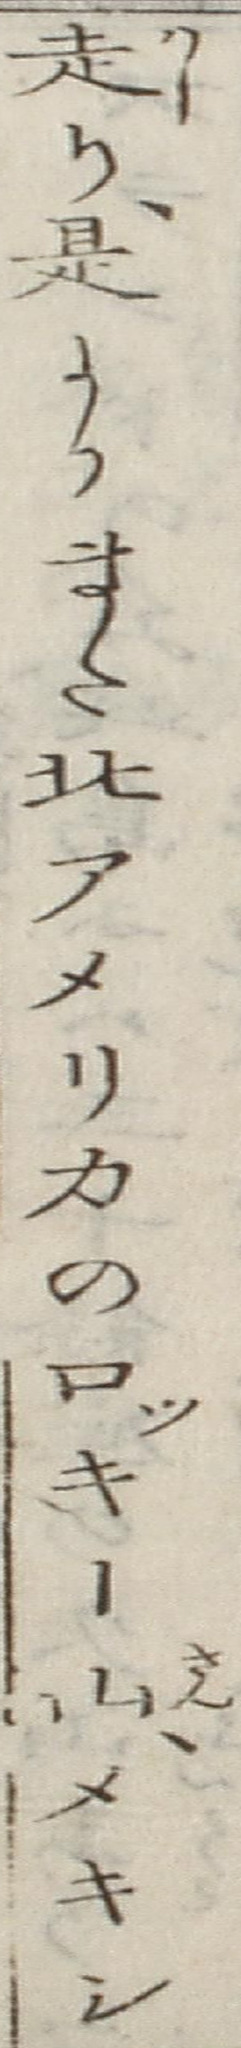走り、是よりまた北アメリカのロッキー山、メキシ
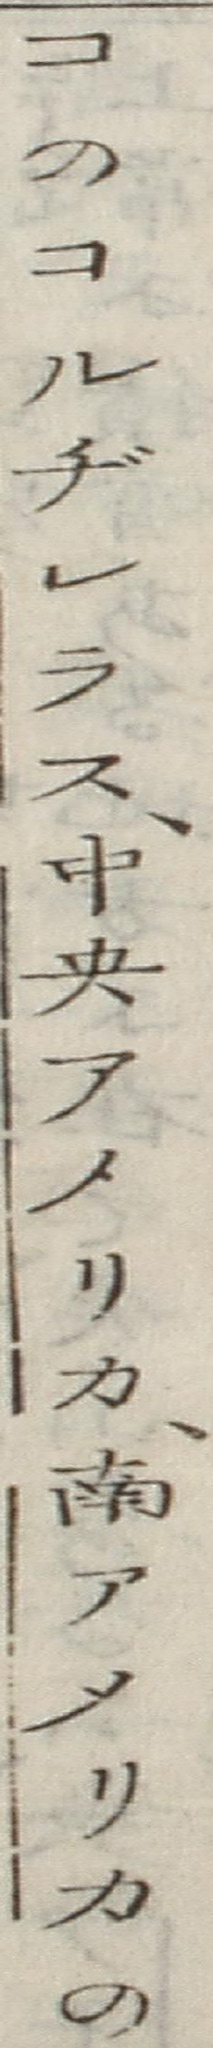コのコルヂレラス、中央アメリカ、南アメリカの
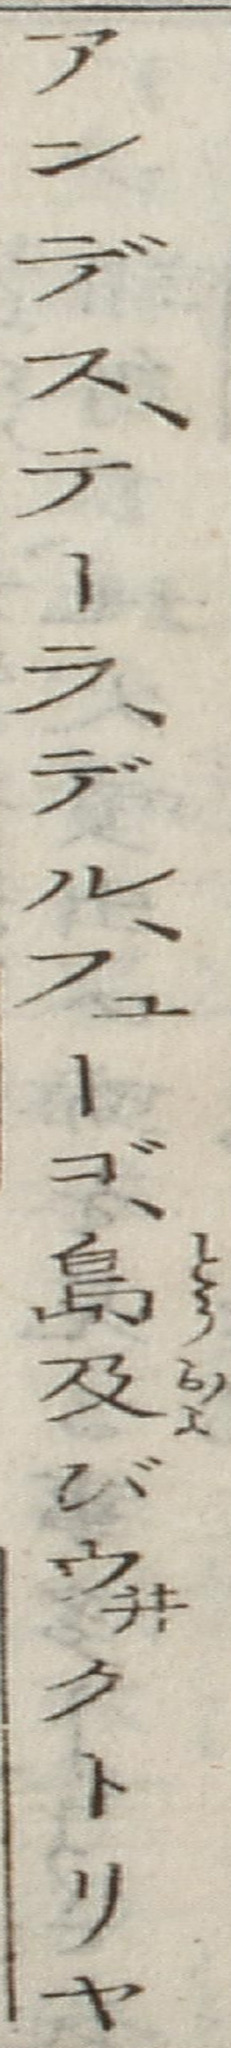アンデス、テーラ、デル、フューゴ、島及びウィクトリヤ
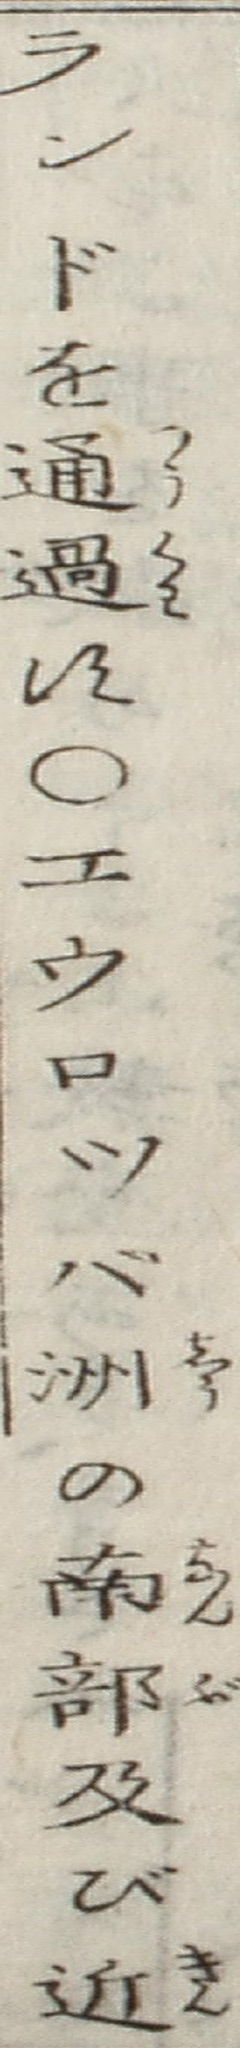ランドを通過す〇エウロツパ洲の南部及び近
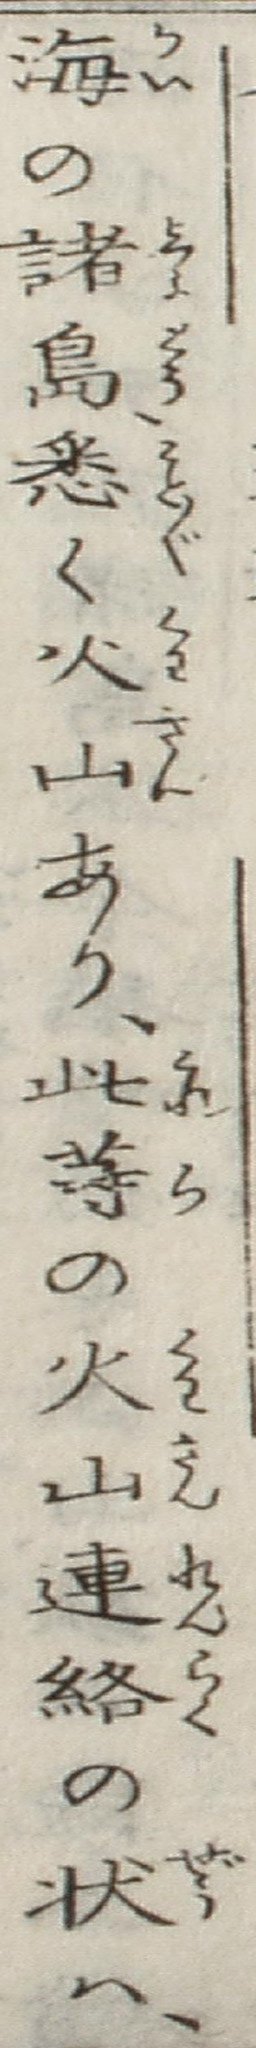海の諸島、悉く火山あり、此等の火山連絡の状は、
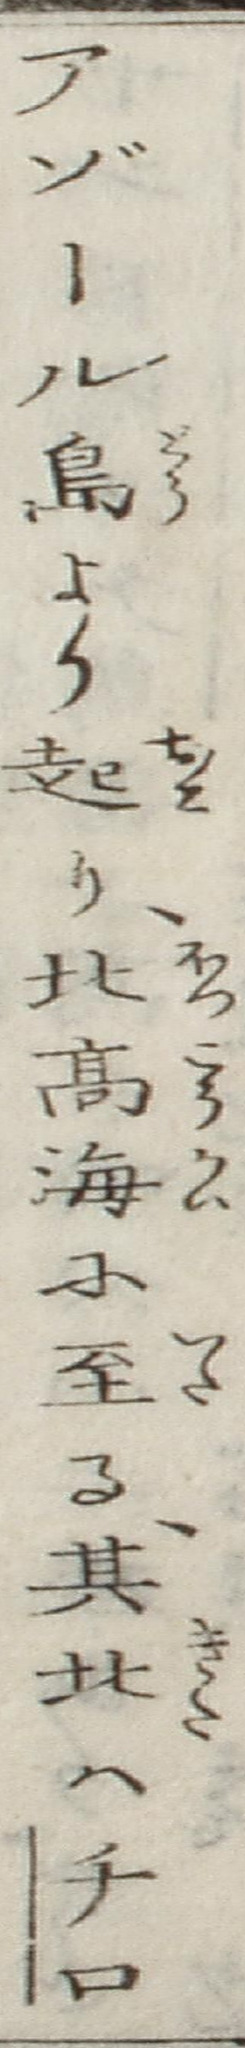アゾール島より起り、北高海に至る、其北はチロ
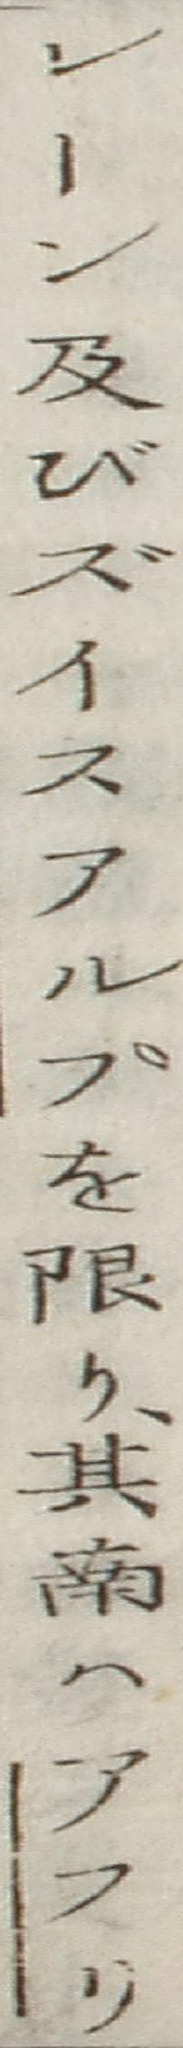レーン及びズイスアルプを限り、其南はアフリ
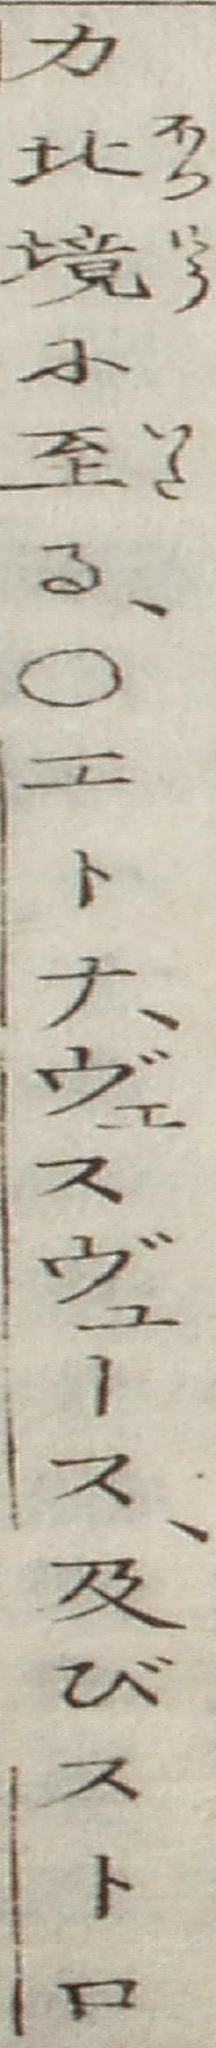カ北境に至る、〇エトナ、ヴェスヴュース、及びストロ

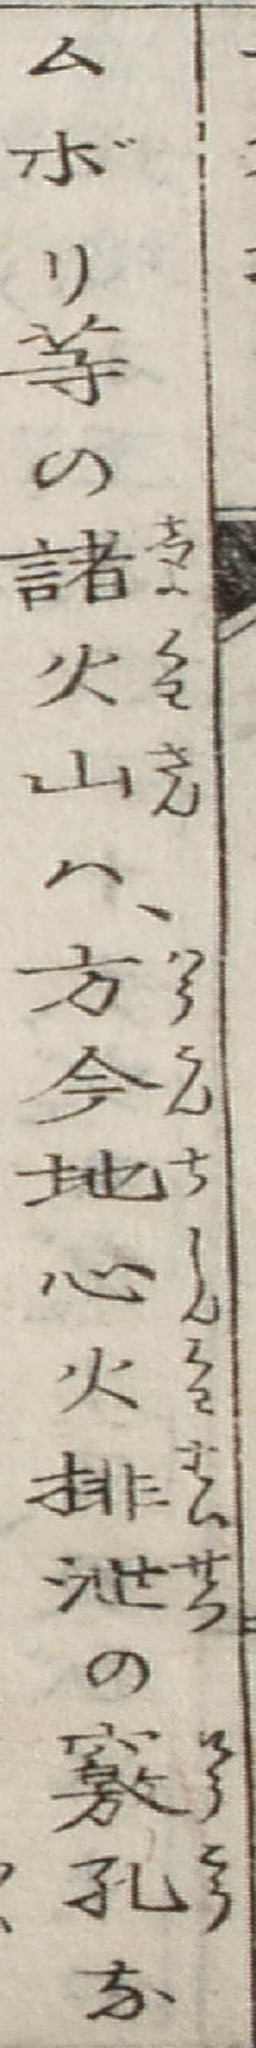ムボリ等の諸火山は、方今地心火排泄の竅孔な
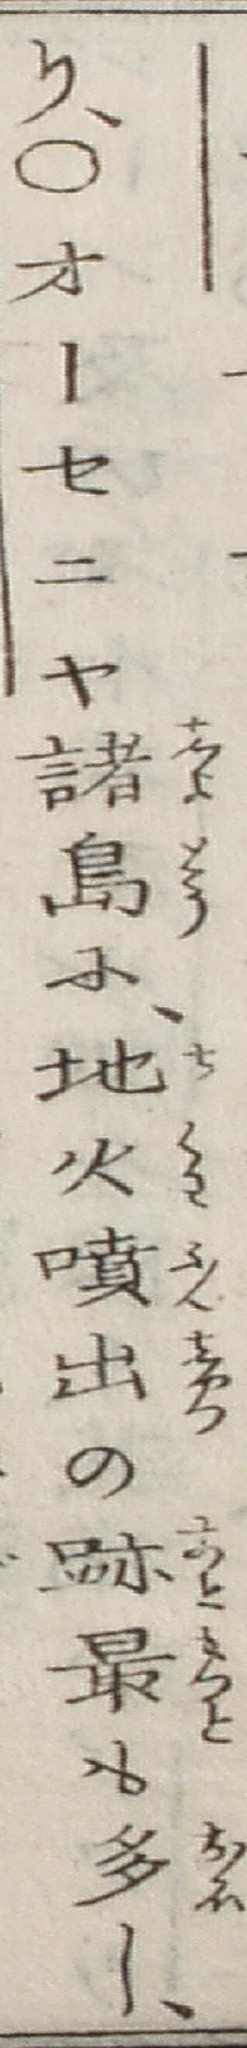り、◯オーセニヤ諸島に、地火噴出の跡最も多し、
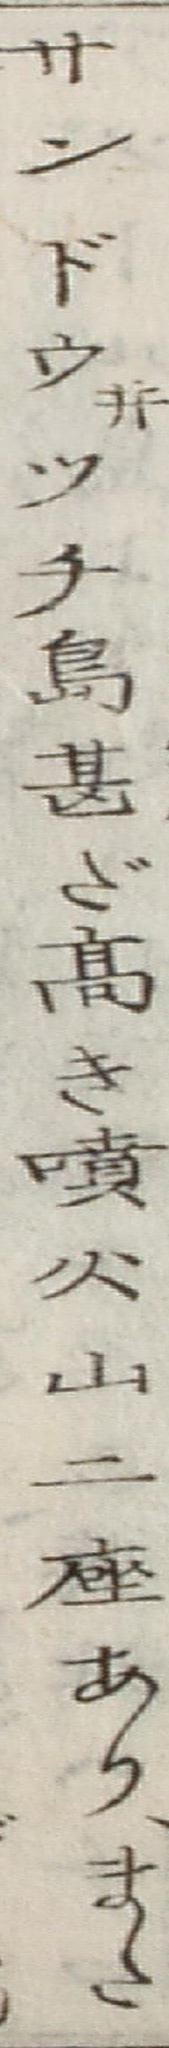サンドウヰツ島甚だ高き噴火山二座あり、また
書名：訓蒙　天然地理學　上
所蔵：東京大学地震研究所図書室 Earthquake Research Institute Library, The University of Tokyo, JAPAN
